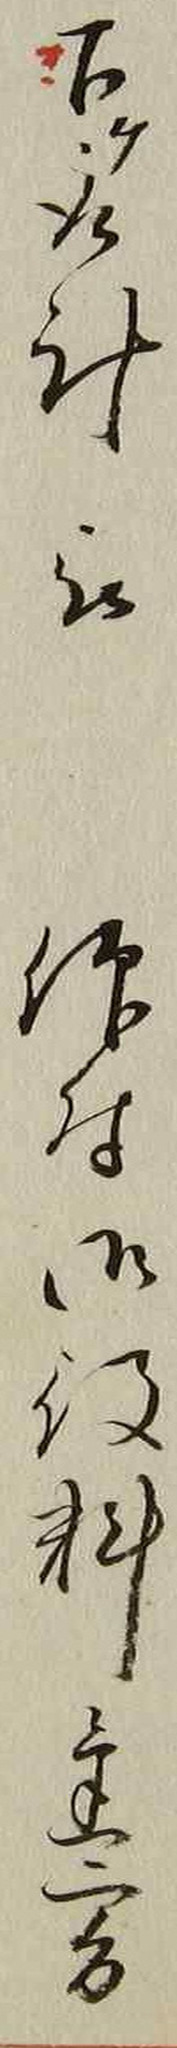下ケ取計被仰付御役料金二分
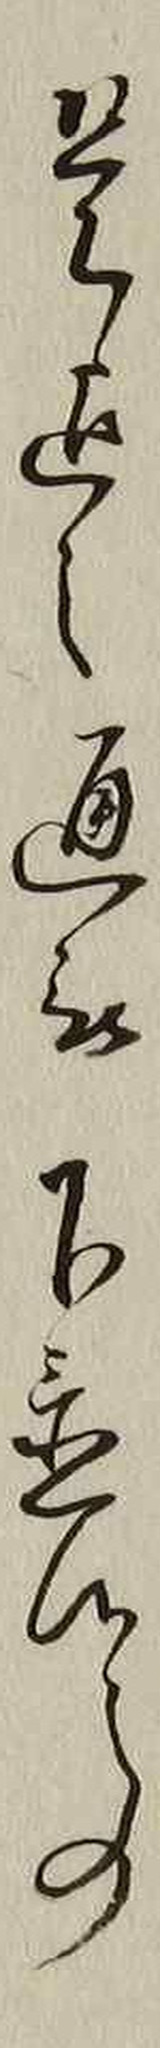是迄之通被下置候事
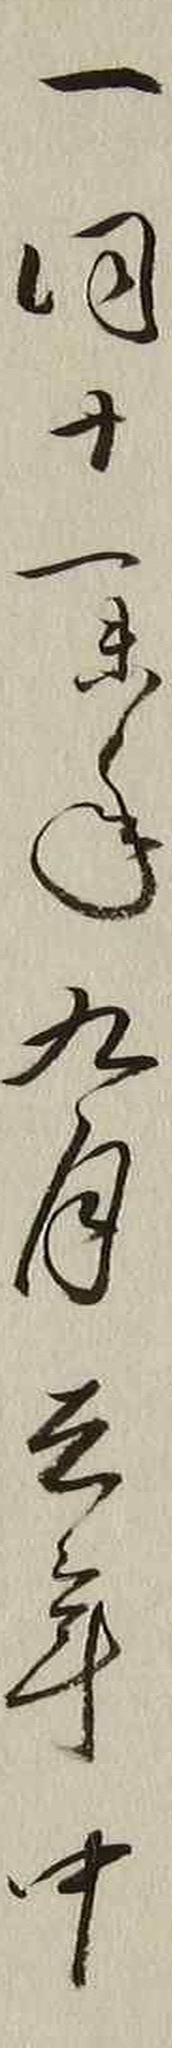一同十一未年九月去年中
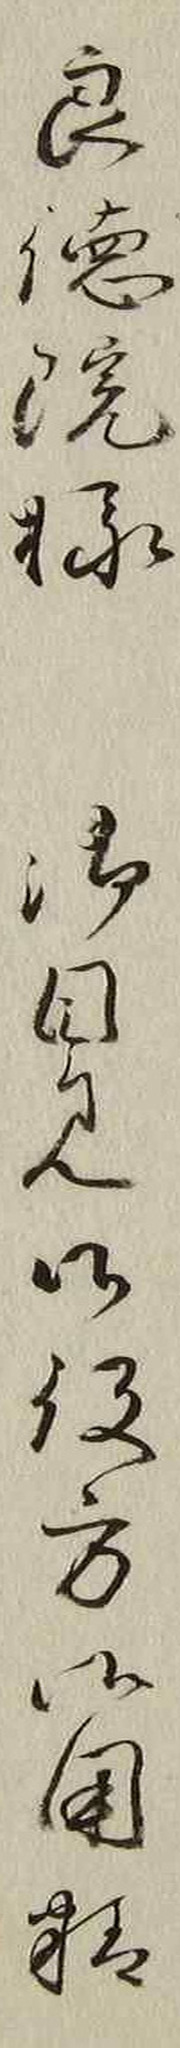良徳院様御目見御役方御用精
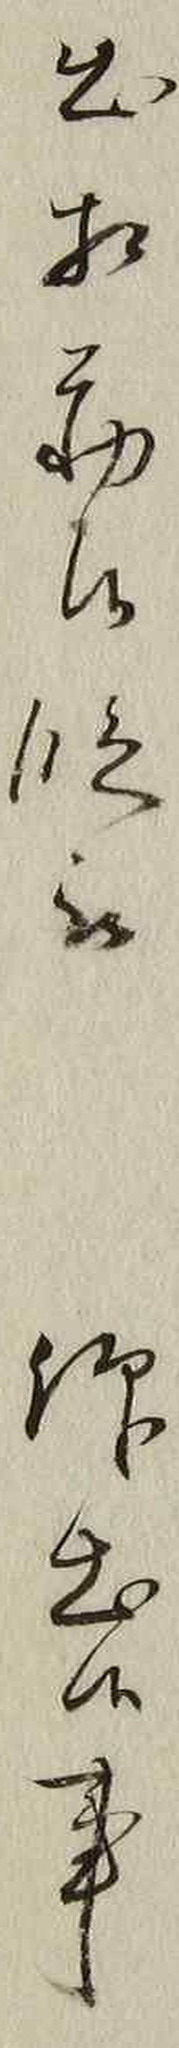出相勤候段被仰出候事
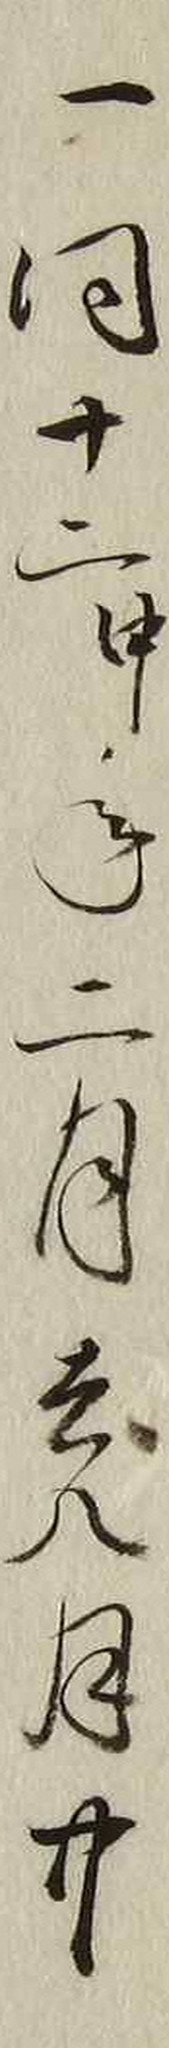一同十二申年二月去八月中
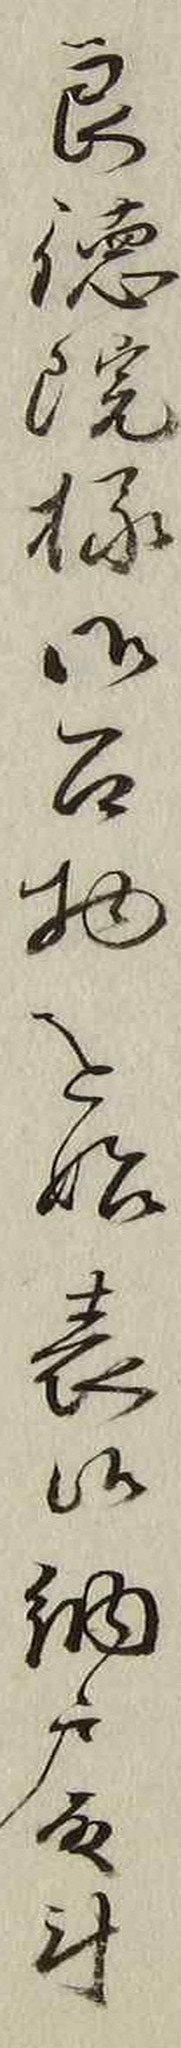良徳院様御召物を始表御納戸取計
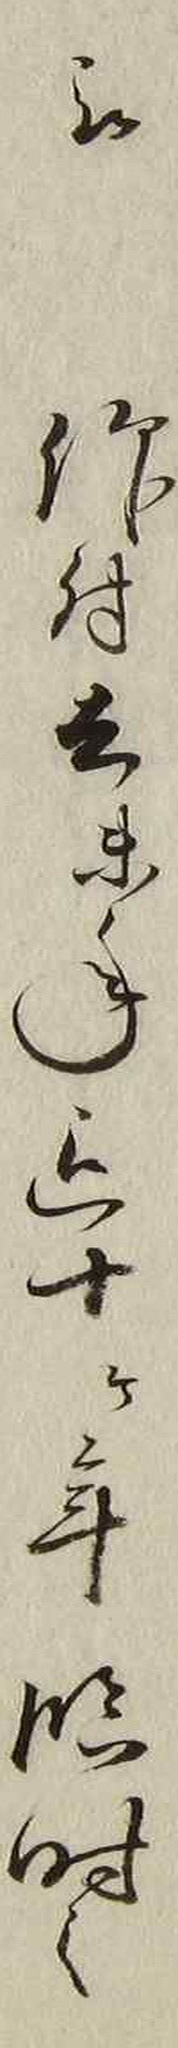被仰付去未年迄十ケ年臨時之
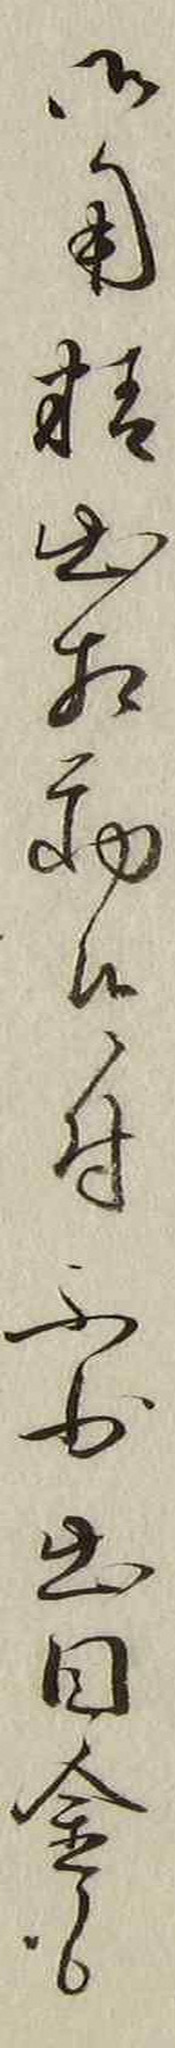御用精出相勤候ニ付不少出目金も
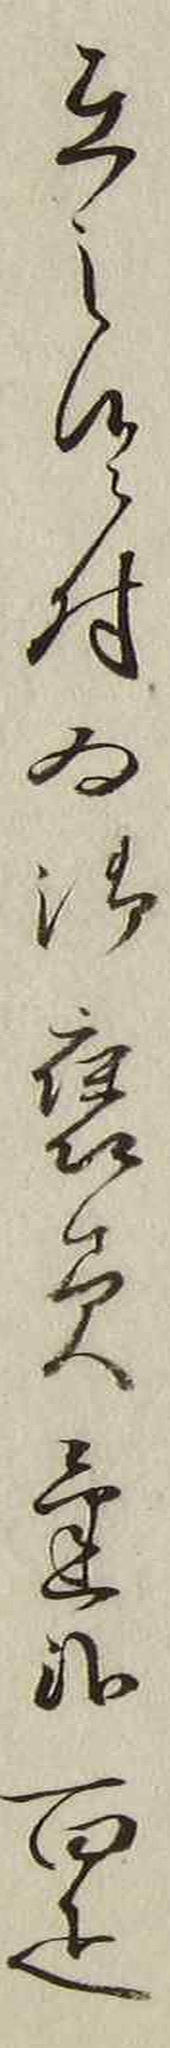在之候ニ付為御褒美金弐百疋
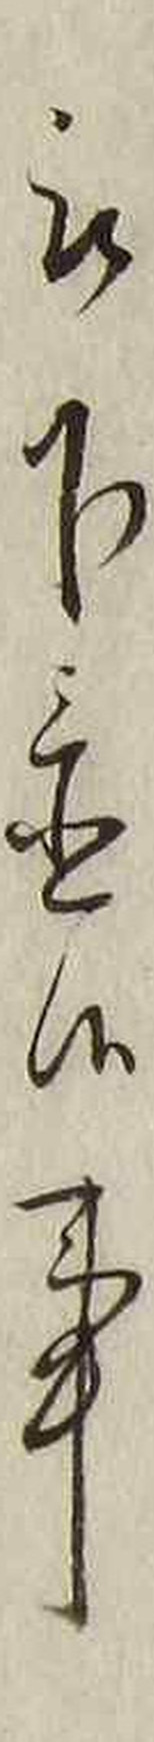被下置候事

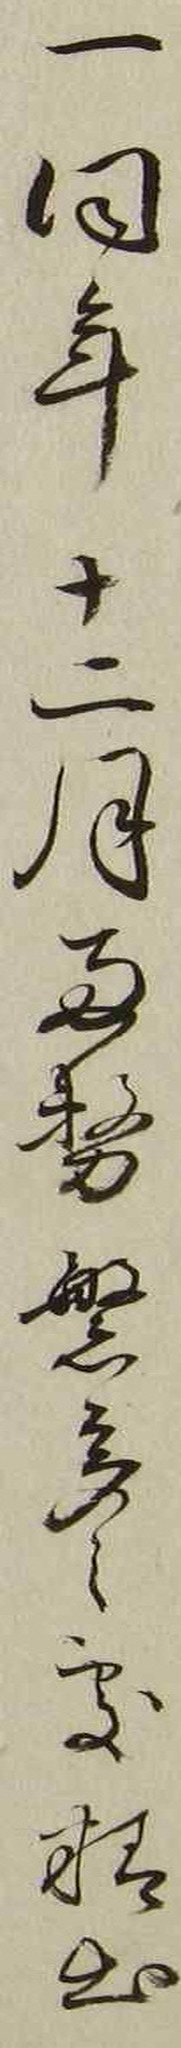一同年十二月両務繫多之処精出
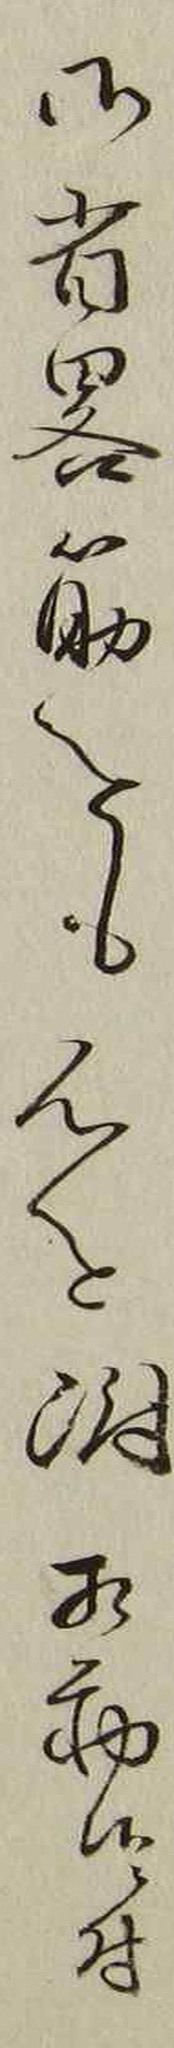御省略筋をも心を附相勤候ニ付
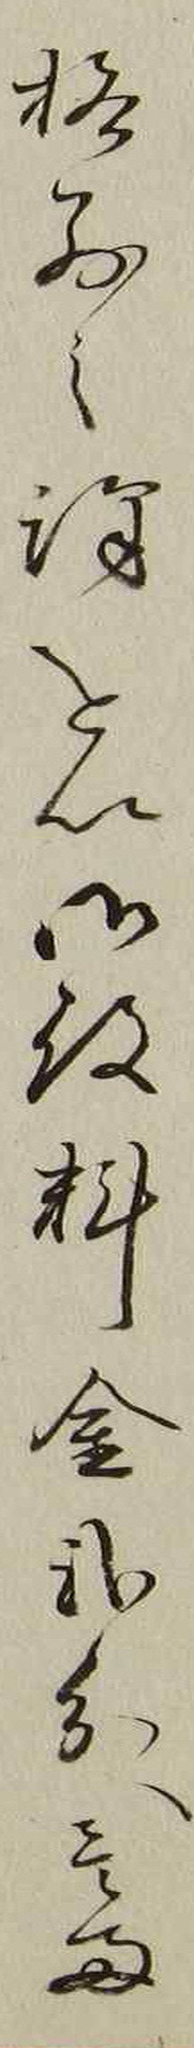格別之訳を以御役料金弐分へ壱両
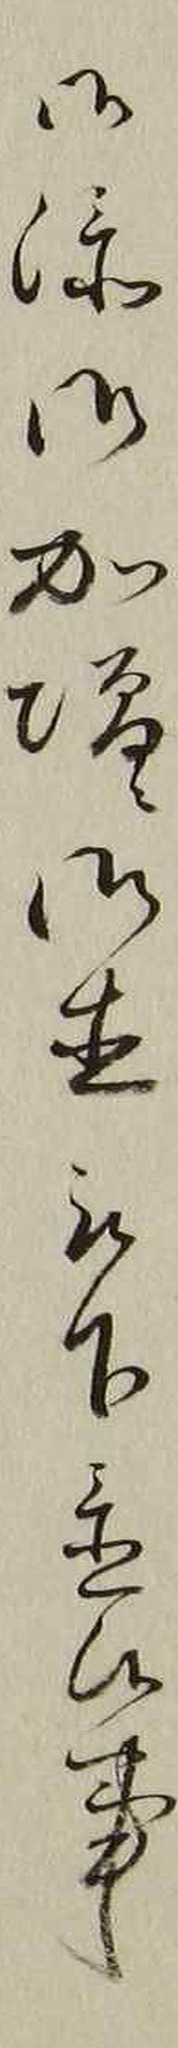御添御加増ニ御直被下置候事
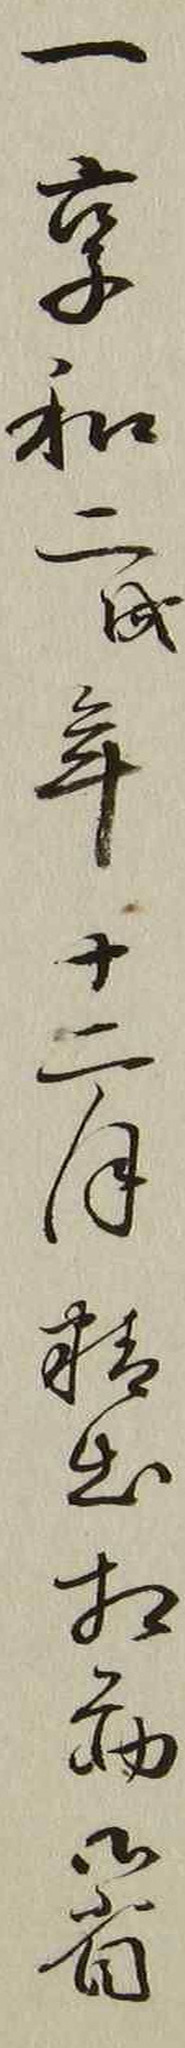一享和二戌年十二月精出相勤御省
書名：諸士系譜　巻之4　い之部4
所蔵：会津若松市立会津図書館
